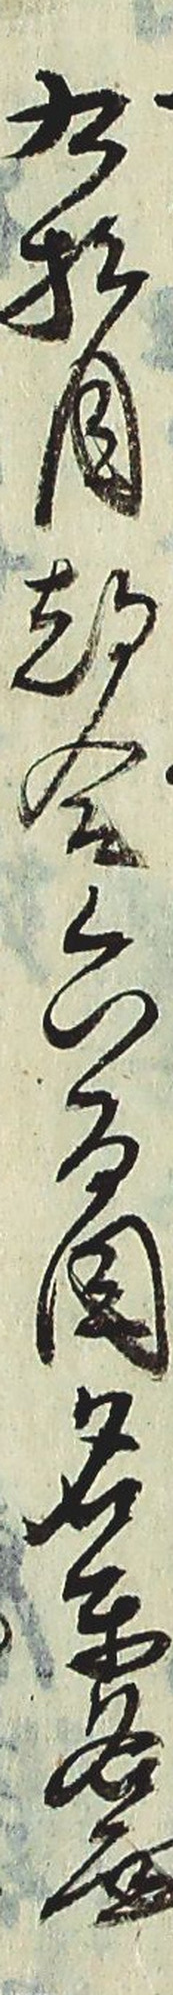九拾目都合六百目名東名西
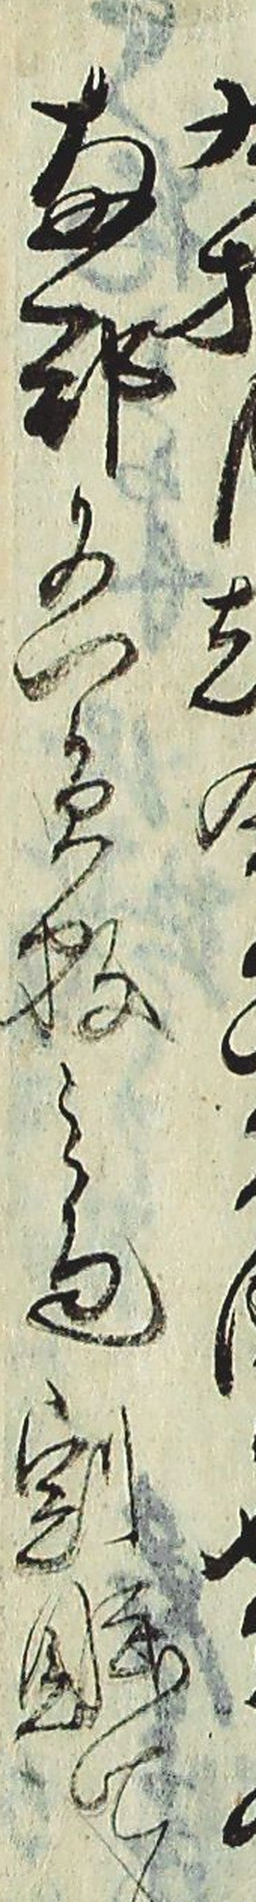両郡右員数之通割賦仕候

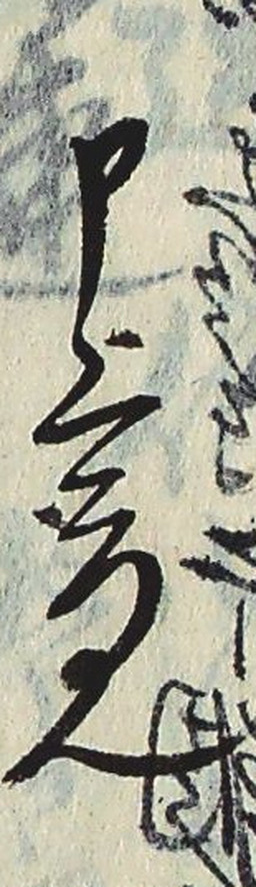申上覚
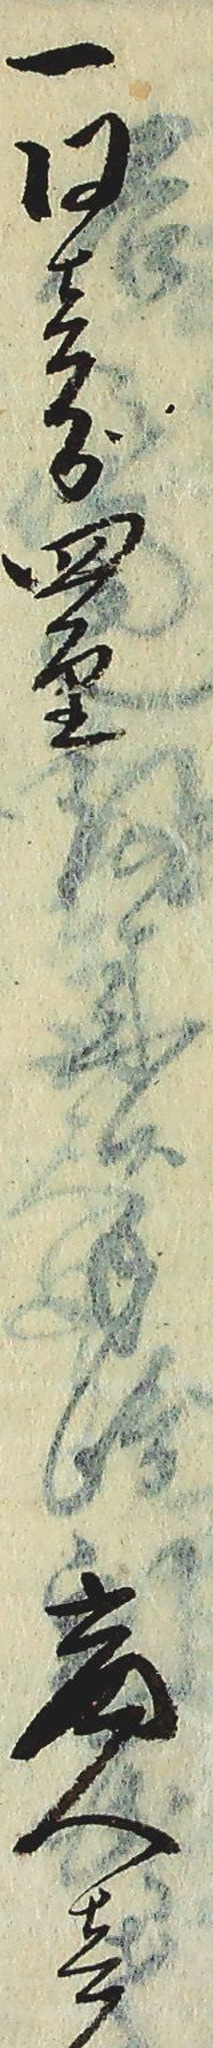一同壱分四厘商人壱人
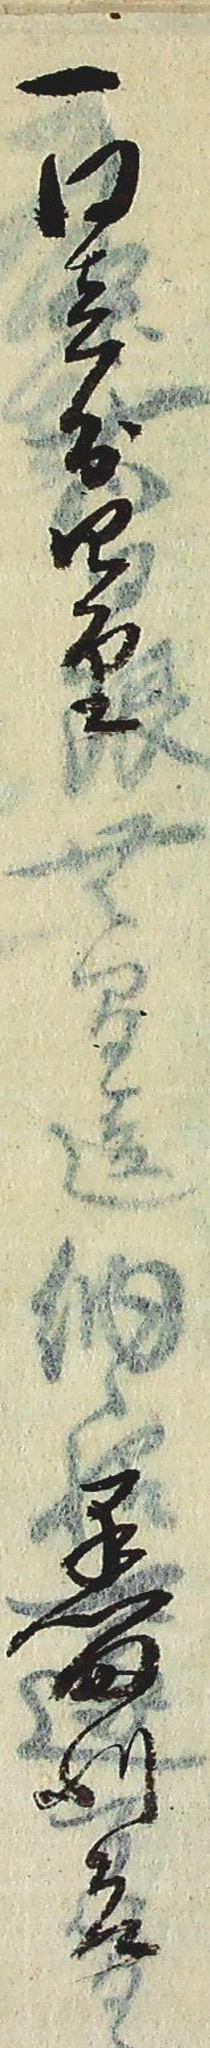一同壱分四厘黒田利吉
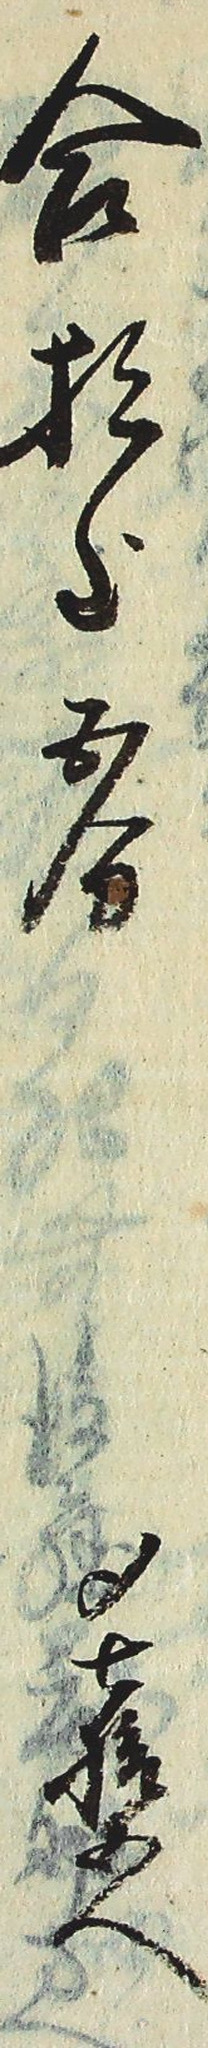合拾匁五分〆七拾五人
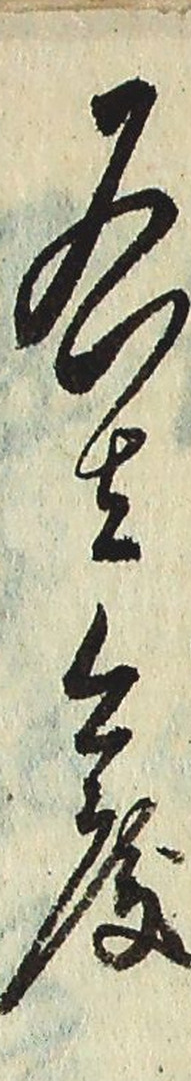右は今度
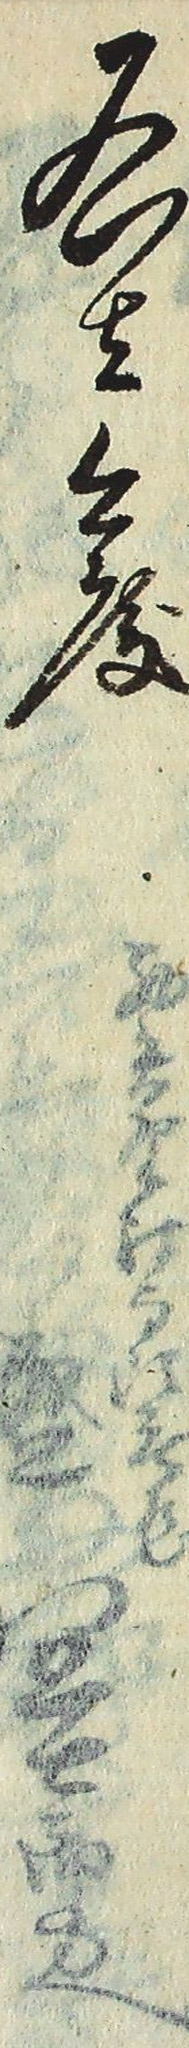右は今度
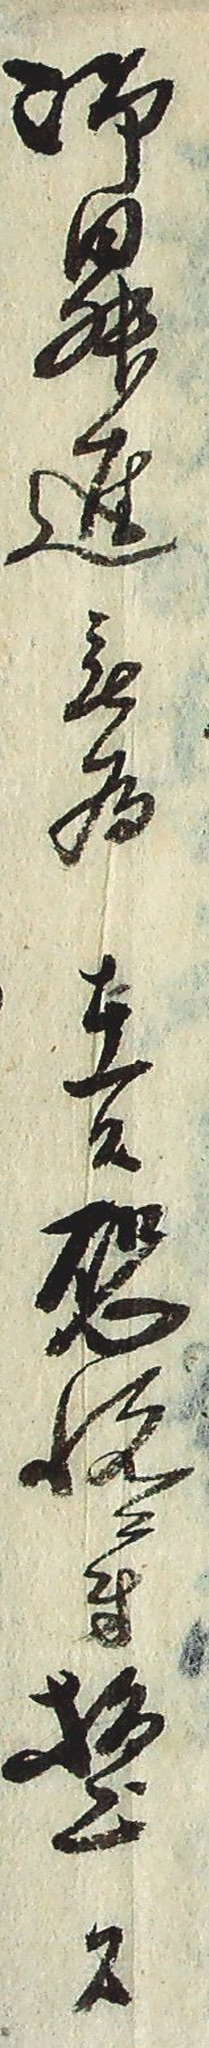御昇進被為在候恐悦に付指上候
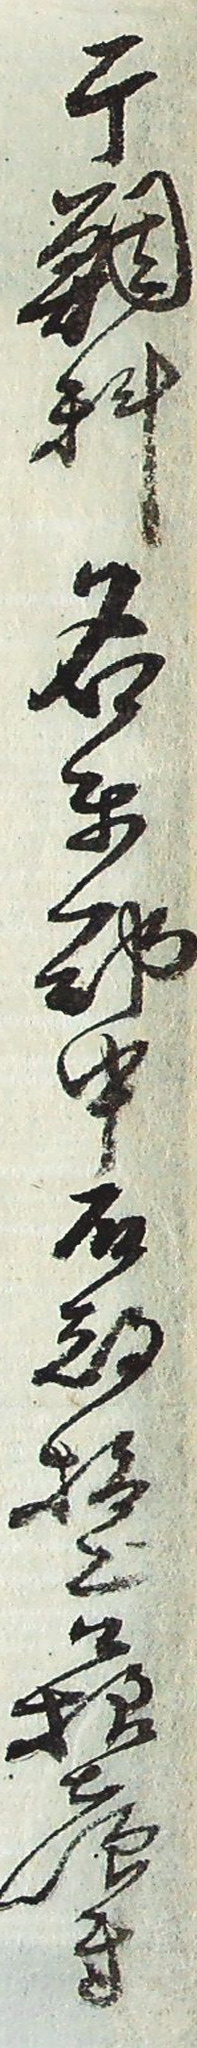干鯛料名東郡中取都指上候様被仰付
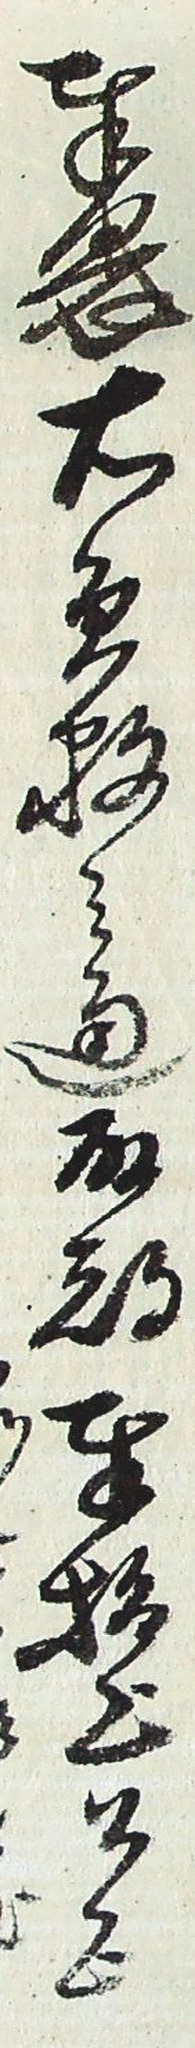奉畏右員数之通取都奉指上候以上
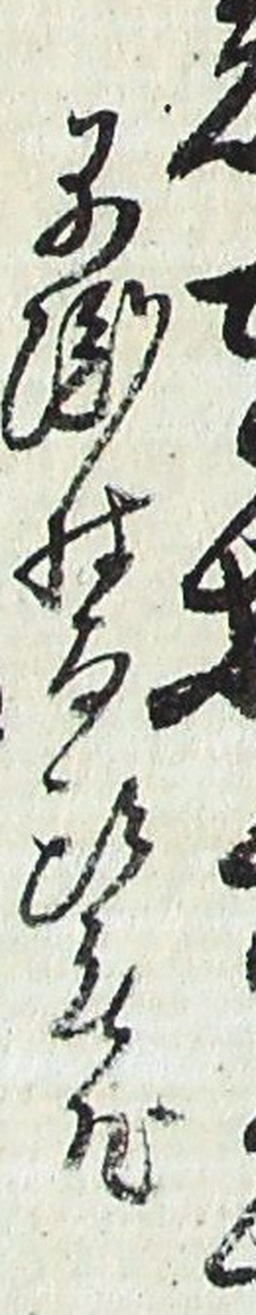早淵村与頭庄屋
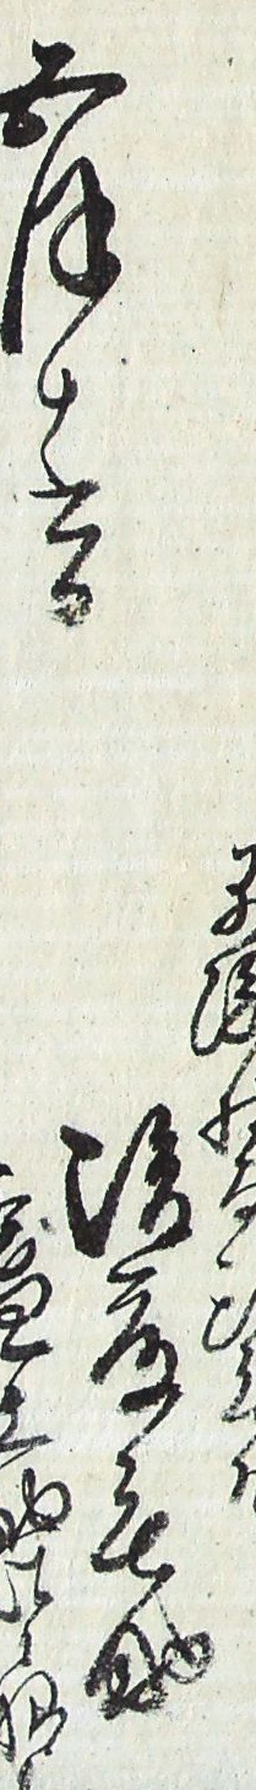五月十六日後藤庄助

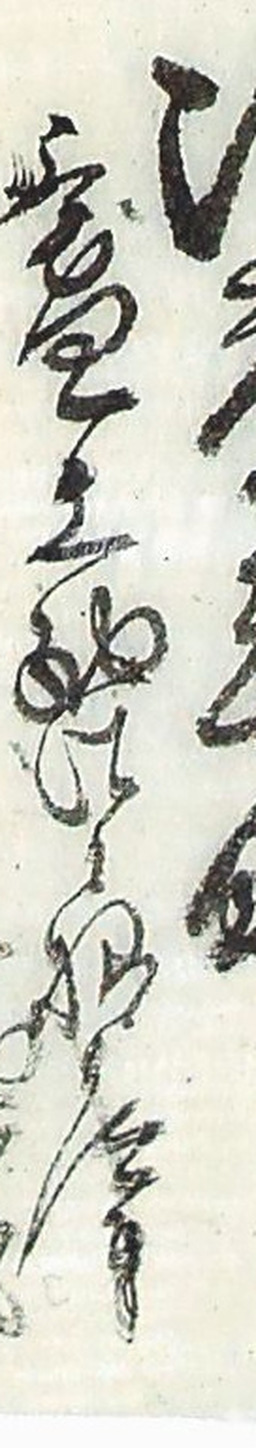盃上納仕候様被仰付
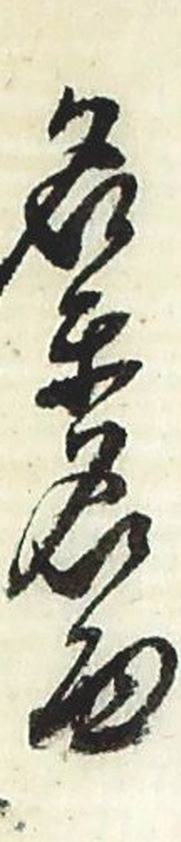名東名西
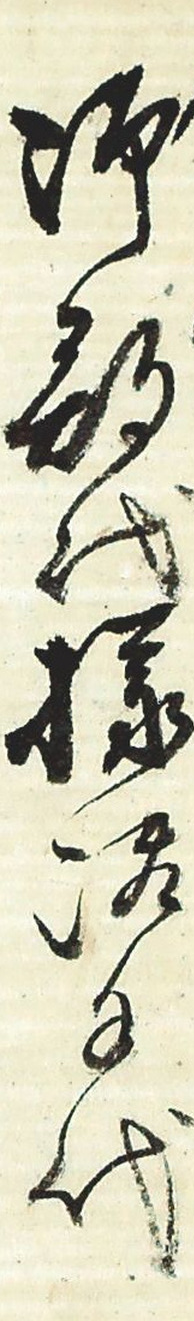御郡代様御手代
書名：名東郡中諸割賦元帳
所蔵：鳴門教育大学 Naruto University of Education
